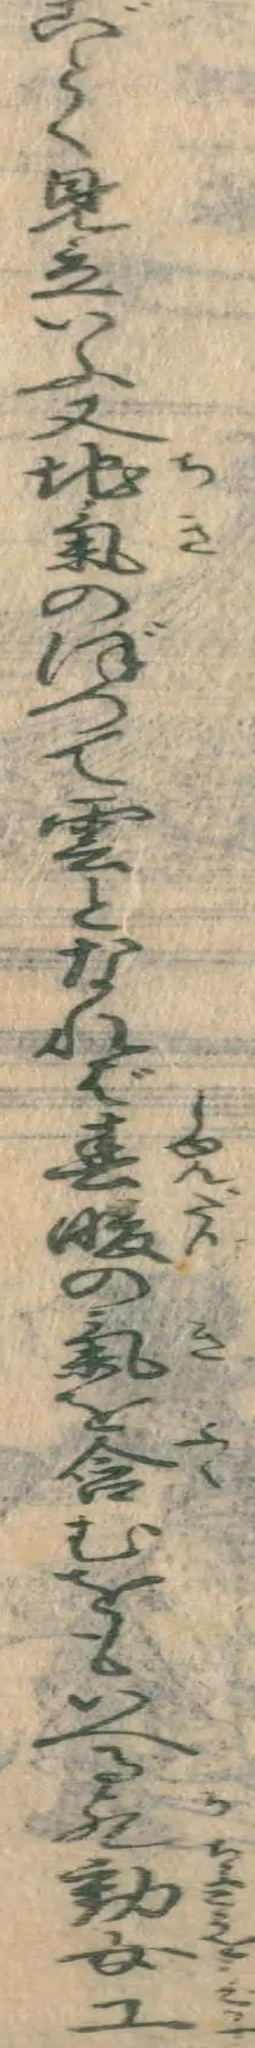ごとく見立いふ又地気のぼつて雲となれば春暖の気を含むをもいへる歟動女工
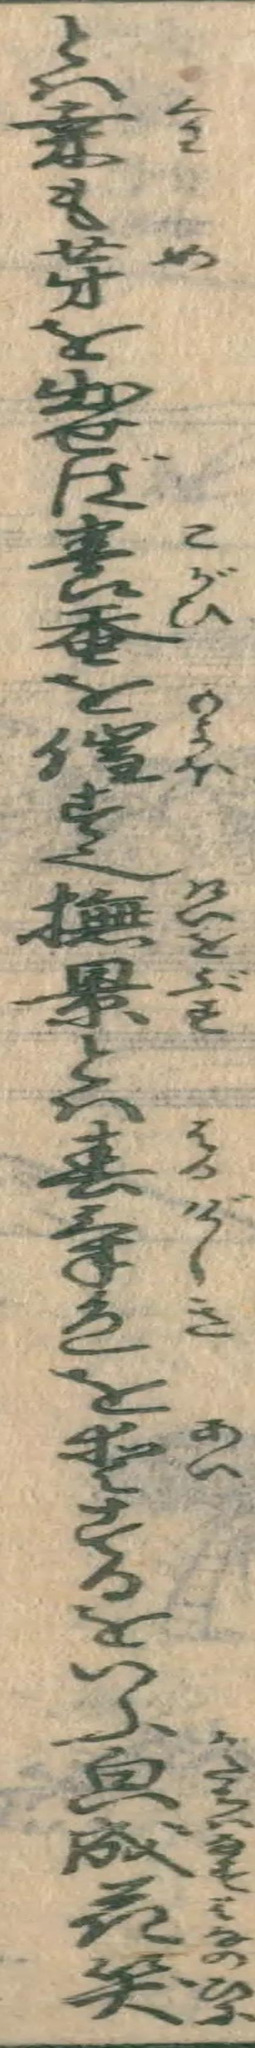とは桑も芽を出せば養蚕を催す也撫景とは春景色を愛するをいふ皃成花笑
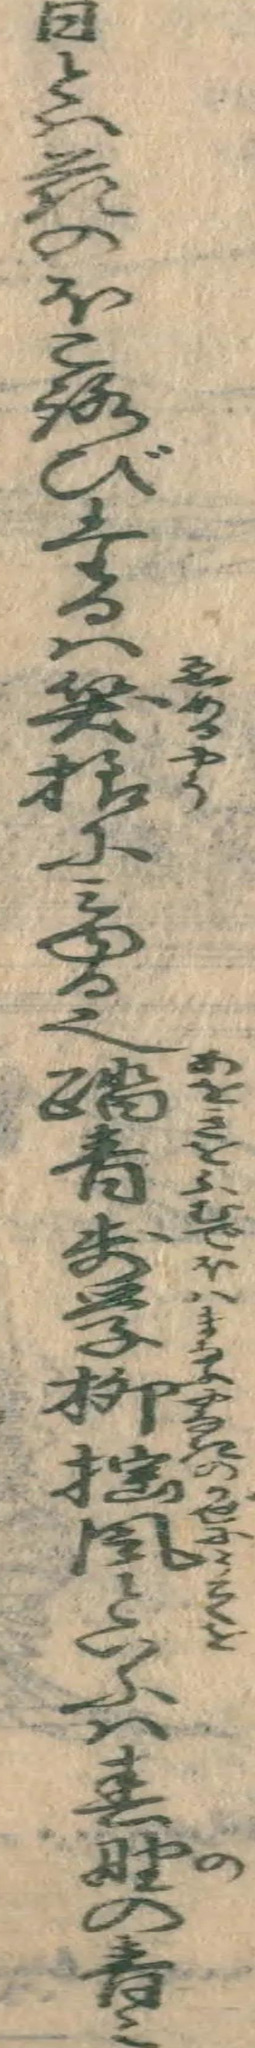日とは花のほころびたるは笑様にみゆる也踏青歩学柳揺風といふは春野の青々
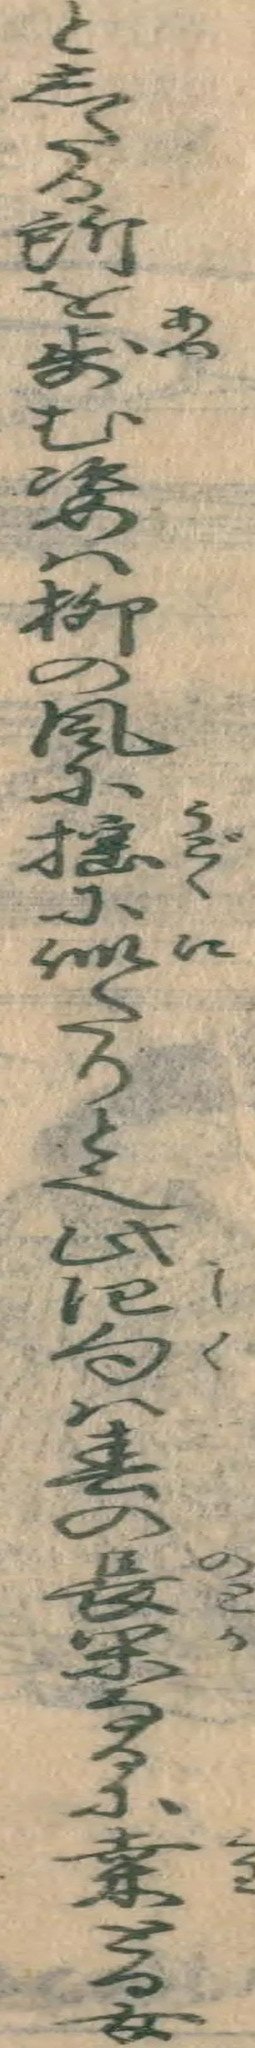としたる所を歩む姿は柳の風に揺に似たりと也此四句は春の長閑なるに桑とる女
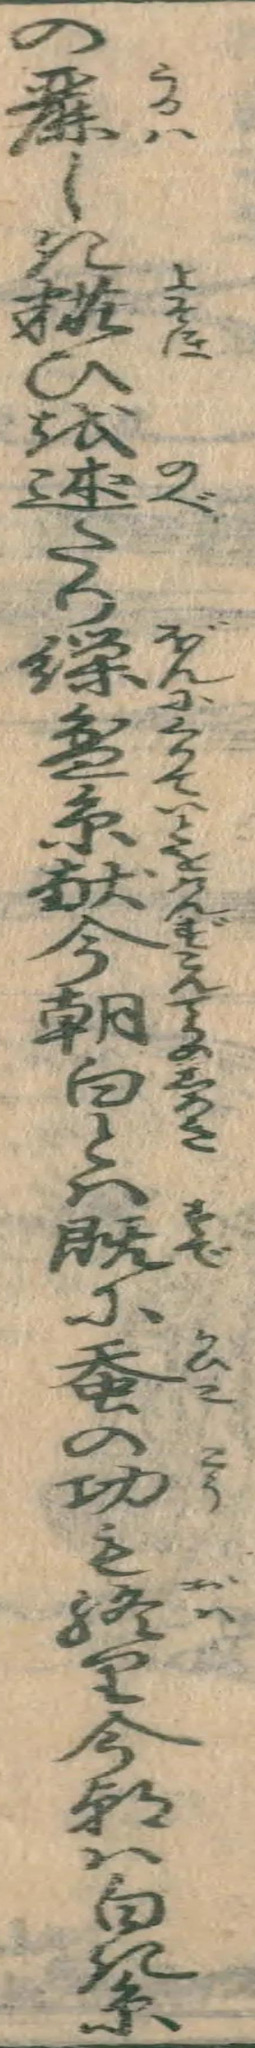の麗しき粧ひを述たり繅盆糸献今朝白とは既に蚕の功も終り今朝は白き糸
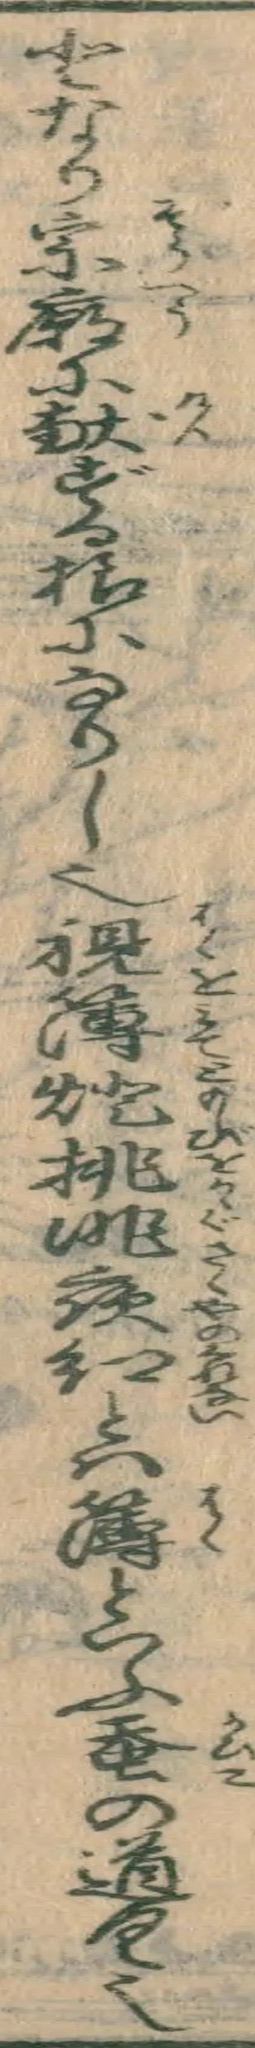となり宗廟に献ずる様になりし也視簿燈挑昨夜紅とは簿といふ蚕の道具也
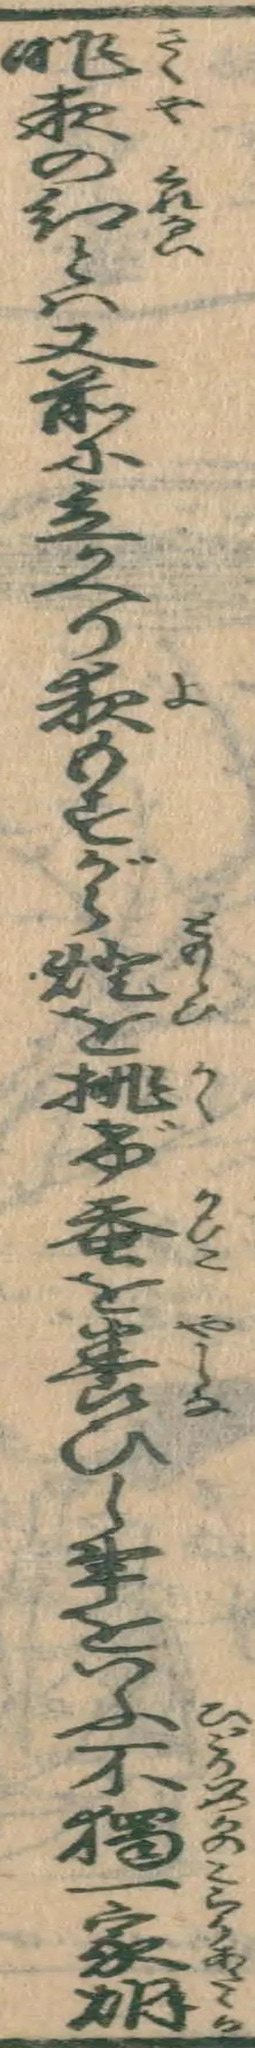昨夜の紅とは又前に立かへり夜もすがら燈を挑げ蚕を養ひし事をいふ不獨一家胡
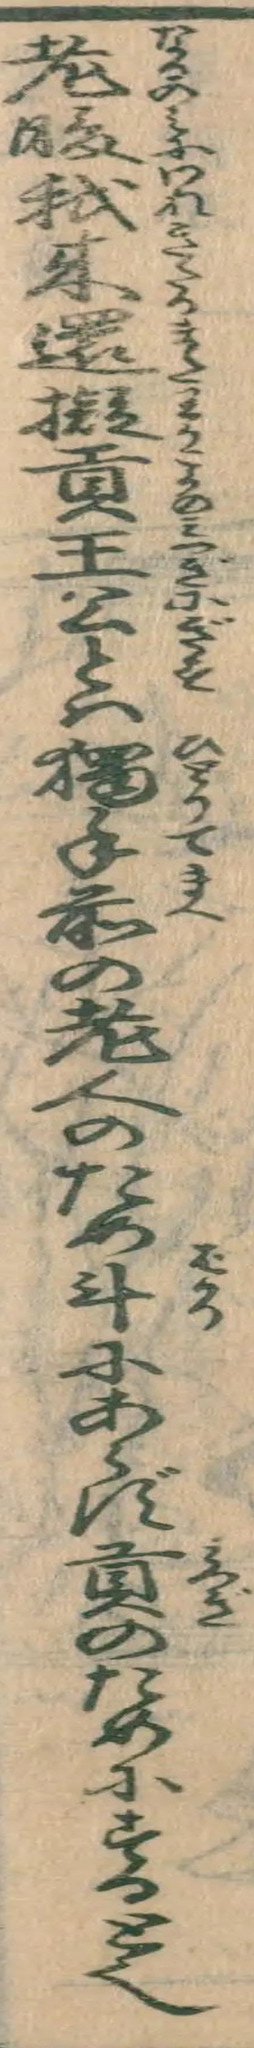老暖我来還擬貢王公とは獨手前の老人のため斗にあらず貢のためにすると也

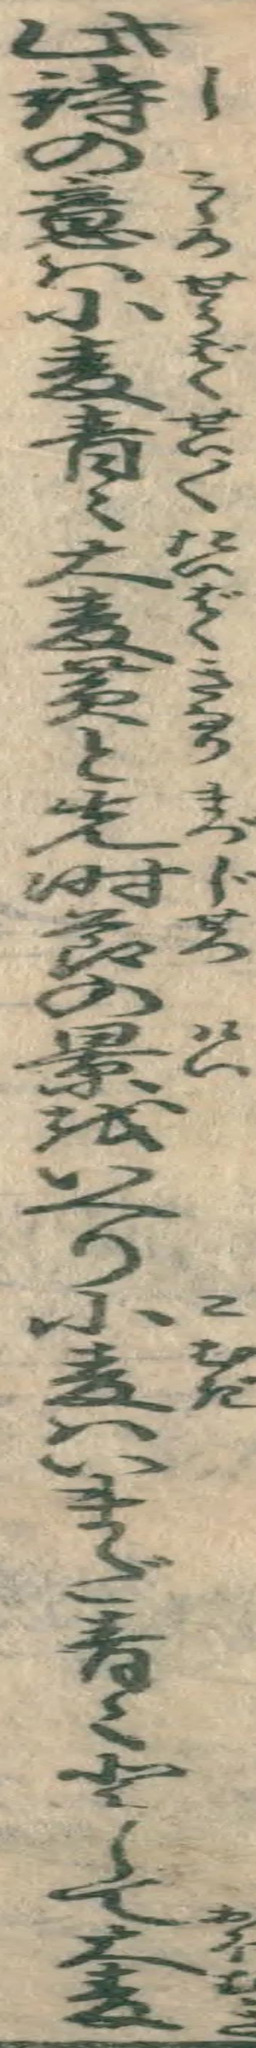此詩の意は小麦青々大麦黄と先時節の景をいへり小麦はいまだ青々として大麦
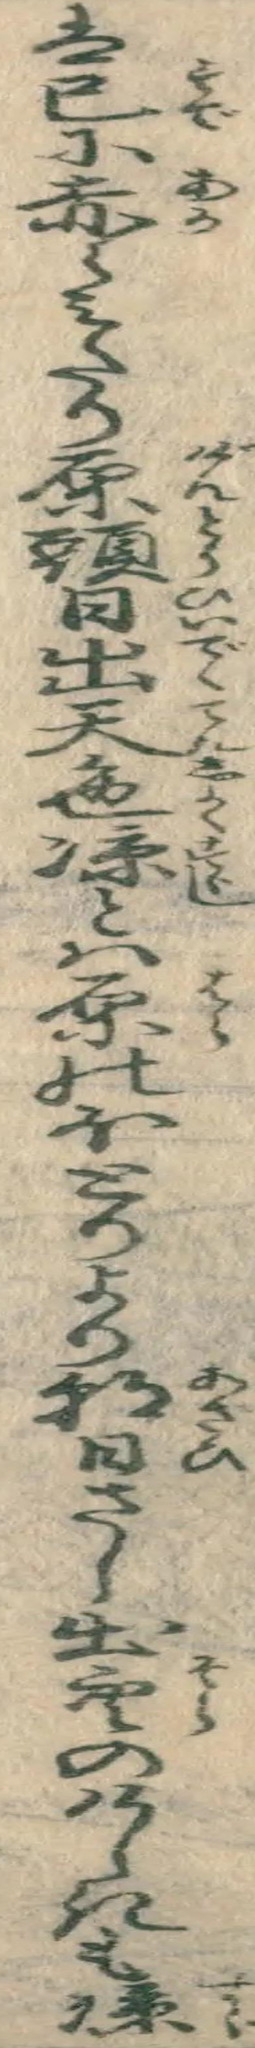は已に赤らみたり原頭日出天色涼とは原のほとりより朝日さし出空のけしきも涼
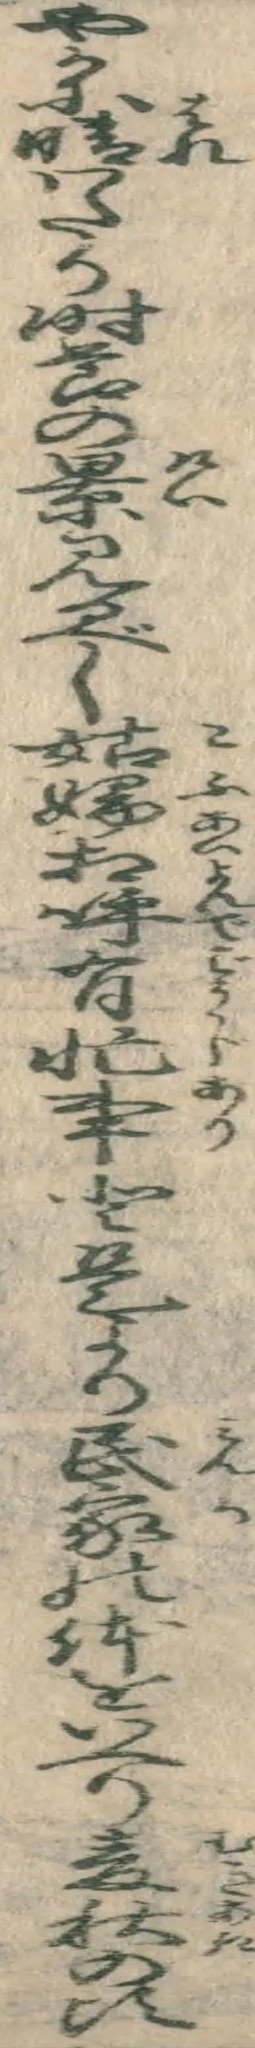やかに晴わたり時節の景見るべし姑婦相呼有忙事と是より民家の体をいへり麦秋の頃
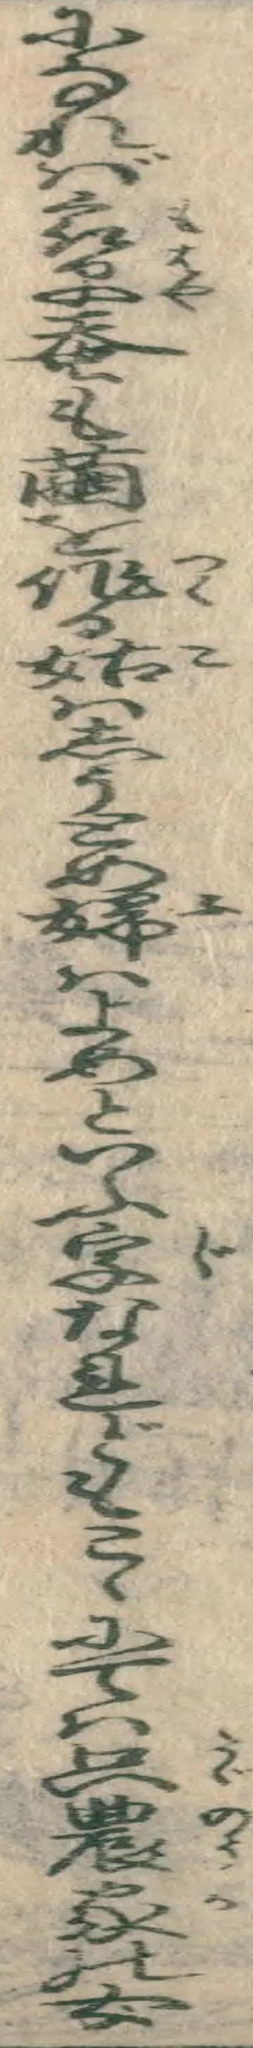になれば最早蚕も繭を作る姑はしうとめ婦はよめといふ字なれどもこゝにては只農家の女
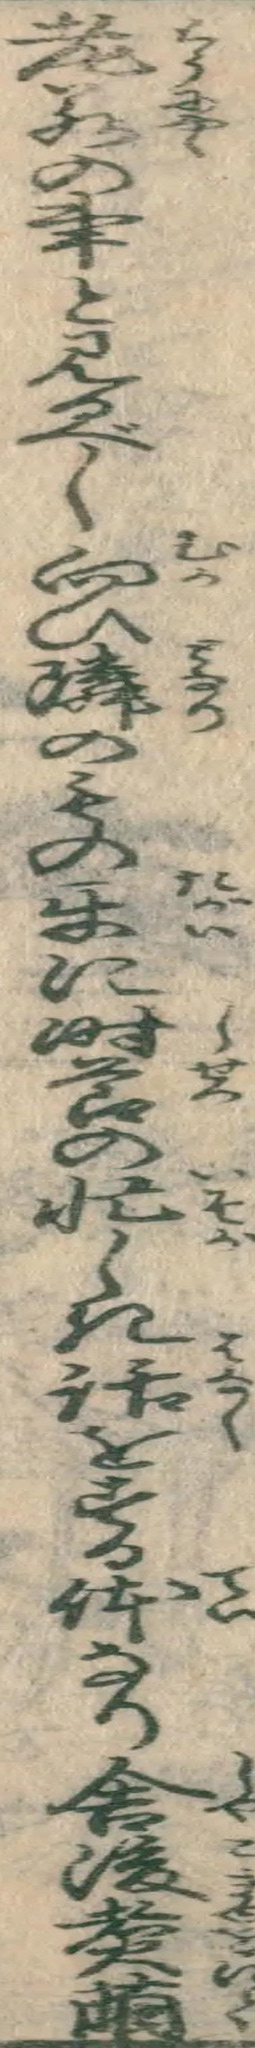老若の事と見るべし向ひ隣のもの互に時節の忙しき話をする体なり舍後煮繭
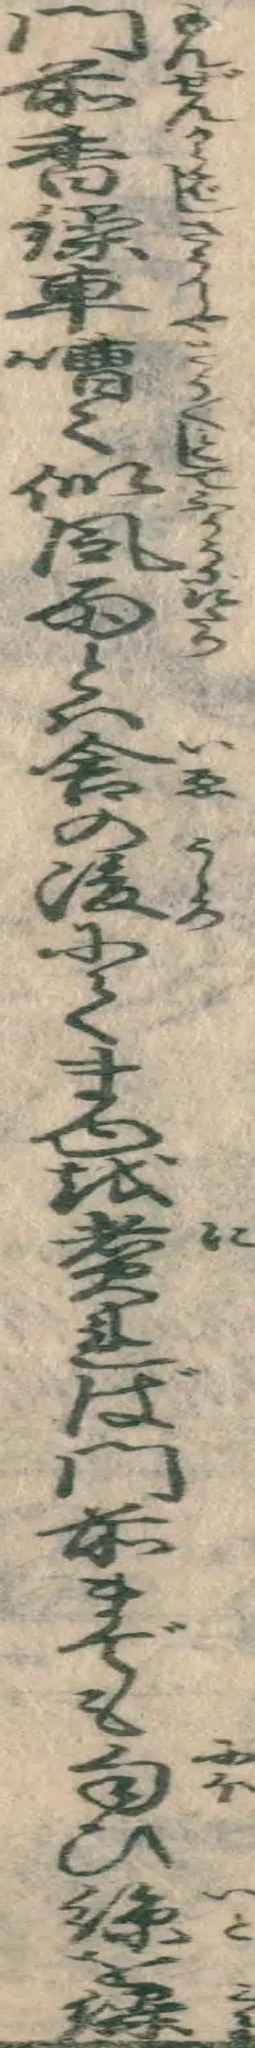門前香繰車嘈々似風雨とは舎の後にてまゆを煮れば門前までも匂ひ糸を繰
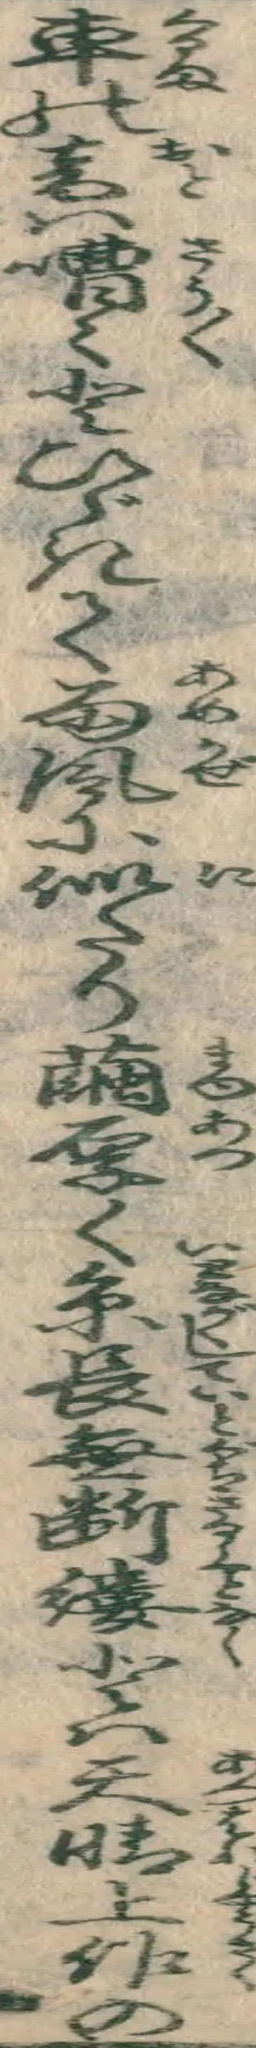車の音は嘈々とひゞきて雨風に似たり繭厚く糸長無断縷とは天晴上作の
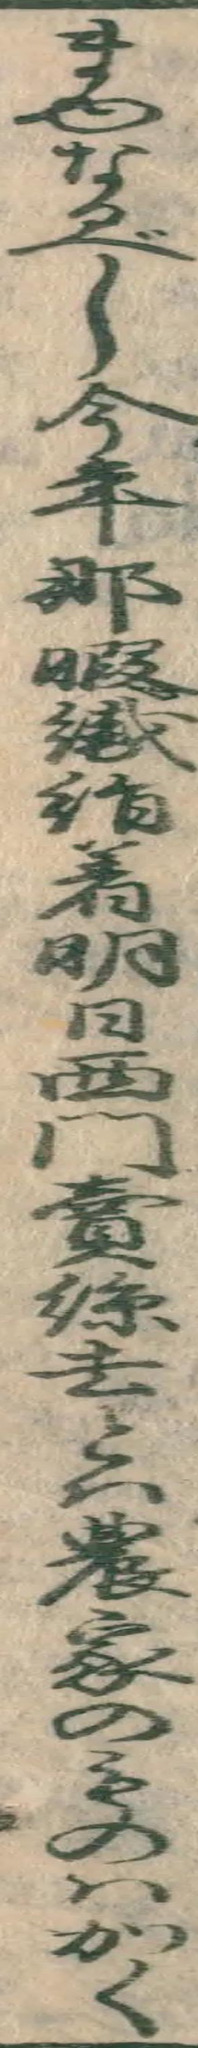まゆなるべし今年那暇織絹着明日西門賣絲去とは農家のものはかく
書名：養蚕秘録 3巻. [3]
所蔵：国立国会図書館 National Diet Library, JAPAN
